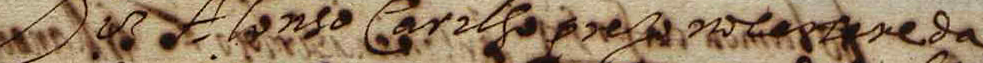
Diz Alonso Carilho prezo no carcere da
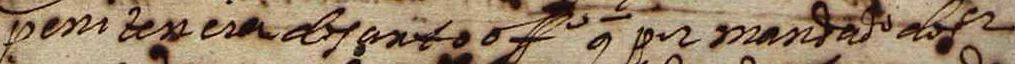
penitencia do santo offo q̄ por mandado do sor
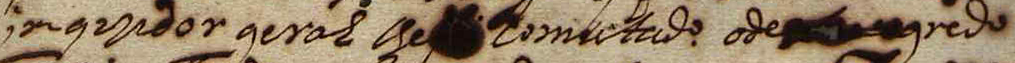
jnqizidor geral lhe foi comutado o de_gredo
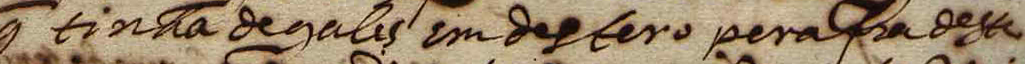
q̄ tinha de gales Em destero pera fora deste
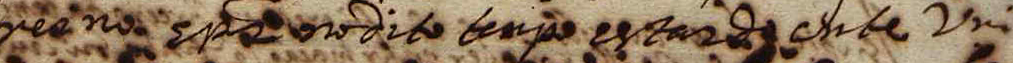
reino E por no dito tenpo estar doente Vm
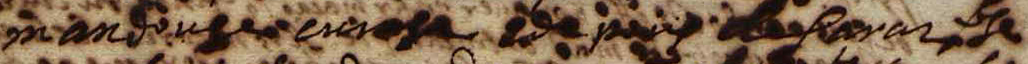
mandou se curase E depois de sarar fose
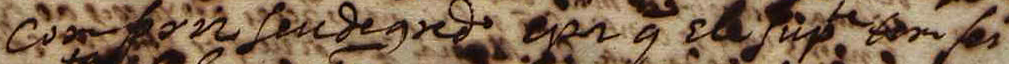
comprir seu degredo e porq̄ Ele supte tem fei
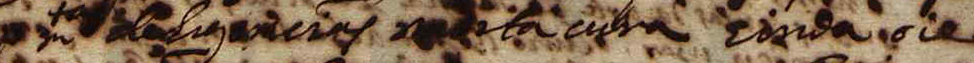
to mtas deligencias na dita cura E inda oie
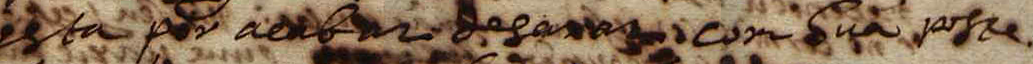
esta por acabar de sarar com huā poste
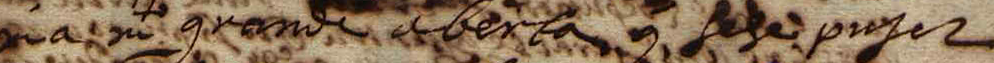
ma mto grande aberta q̄ se se puzer
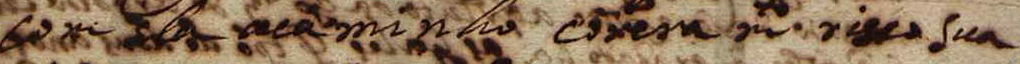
com Ela a caminho corera mto risco sua
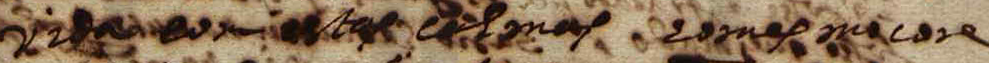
vida com estas calmas. E o mesmo core
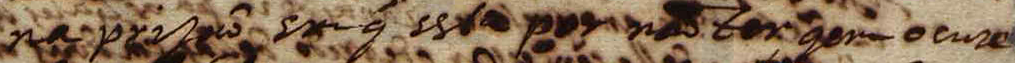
na prizão Em q̄ esta por naõ ter qem o cure
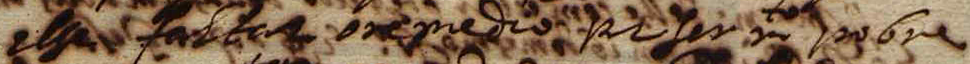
E lhe faltar o remedio por ser mto pobre
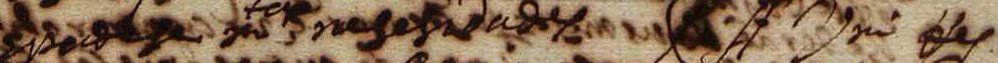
E padese mtas nesesidades P. A. V m̄ Res
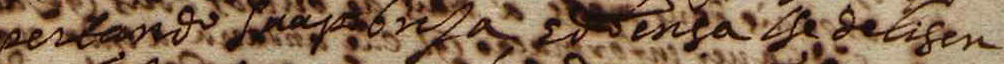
peitando sua pobreza E doensa lhe de lisen
